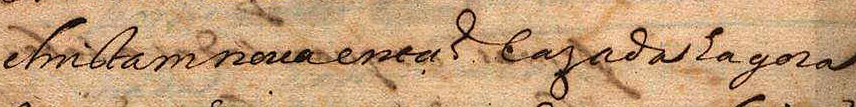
christam noua entaõ cazada E agora
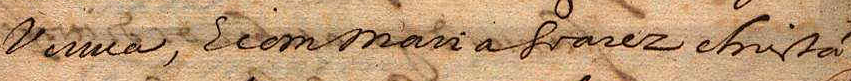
Viuua, E com maria soarez christã
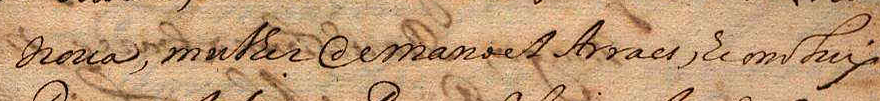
noua, mulher de manoel Arraes, E com Luis
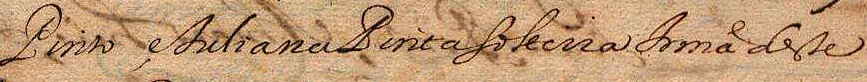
Pinto, e Juliana Pinta solteira Irmã deste
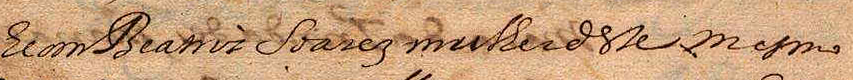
E com Beatriz Soarez mulher deste mesmo
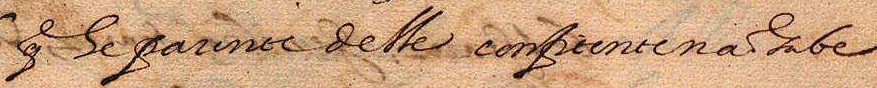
q̄ he parente delle confitente naõ sabe
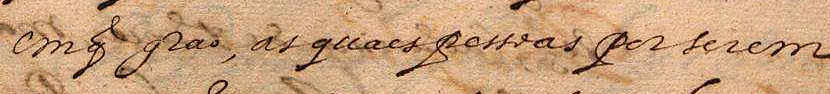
em q̄ grao, as quaes pessoas por serem
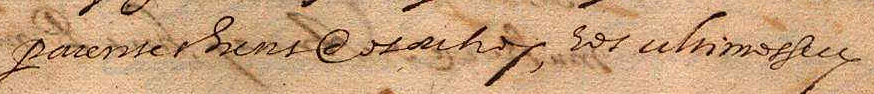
parentes huns dos outros, E os ultimos seus
